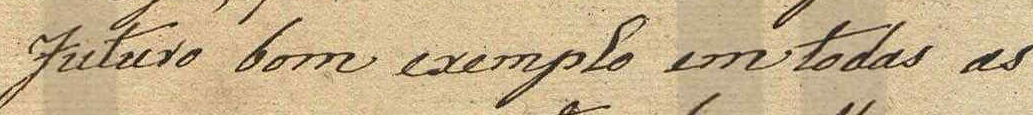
futuro bom exemplo em todas as
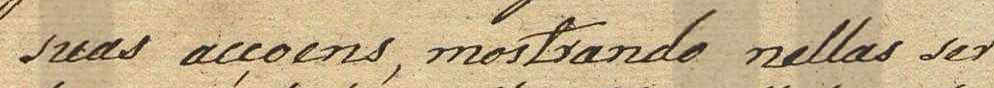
suas acçoens, mostrando nellas ser
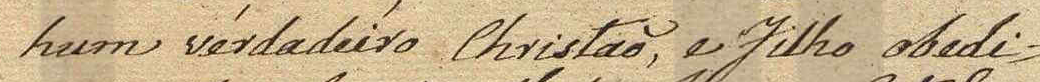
hum verdadeiro Christaõ, e filho obedi
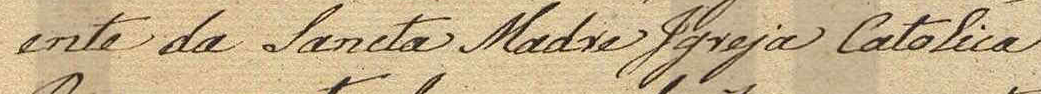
ente da Sancta Madre Jgreja Catolica
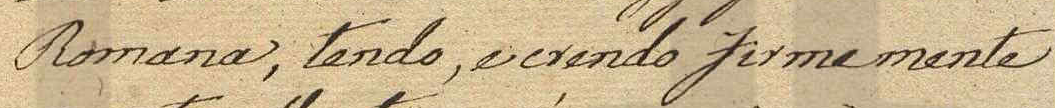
Romana, tendo, e crendo firmemente
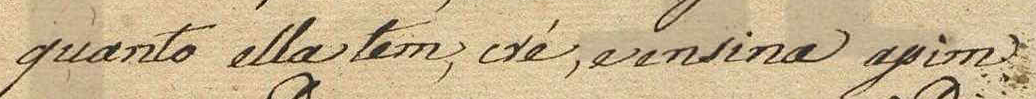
quanto ella tem, cré e ensina assim
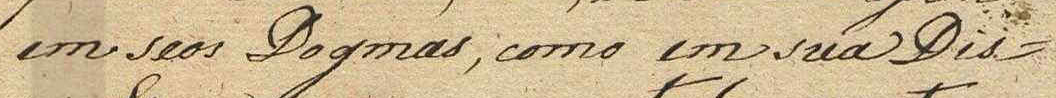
em seos Dogmas, como em sua Dis
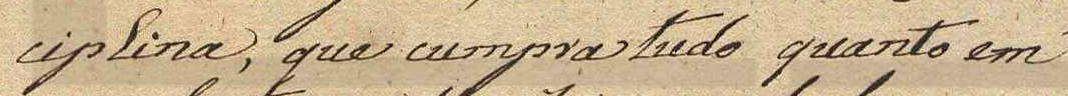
ciplina, que cumpra tudo quanto em
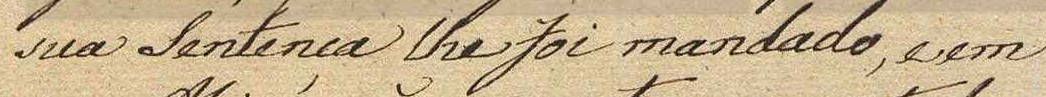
sua Sentença lhe foi mandado, e em
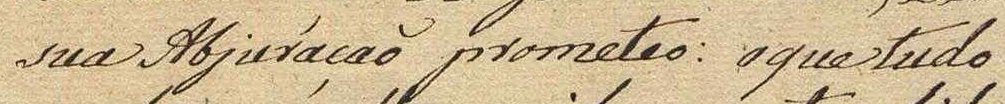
sua Abjuraçaõ prometeo: o que tudo
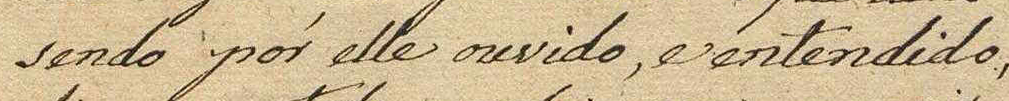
sendo por elle ouvido, e entendido,
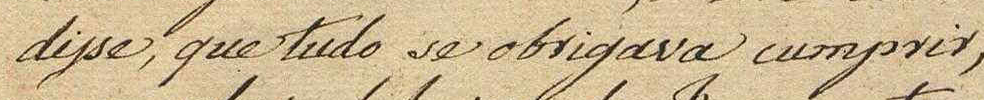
disse, que tudo se obrigava cumprir,
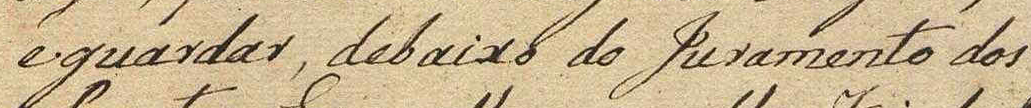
e guardar, debaixo do Juramento dos
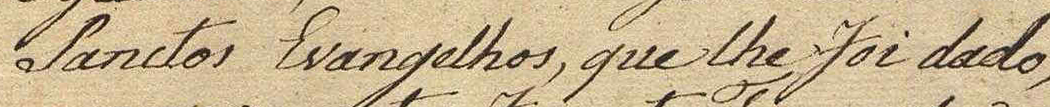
Sanctos Evangelhos, que lhe foi dado,
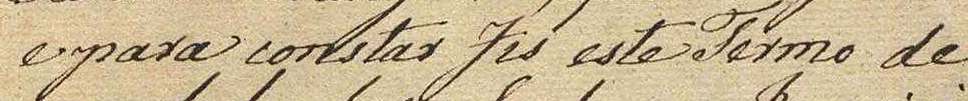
e para constar fis este Termo de
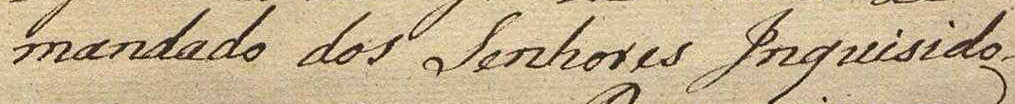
mandado dos Senhores Jnquisido
